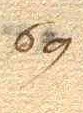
69
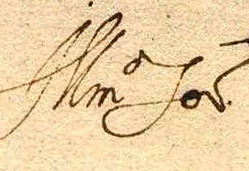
Jllmo Sor̄.
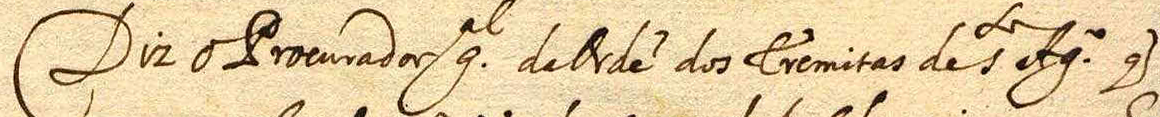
Diz o Procurador g.al da Ordē dos Eremitas de s.to Ag.o q̄
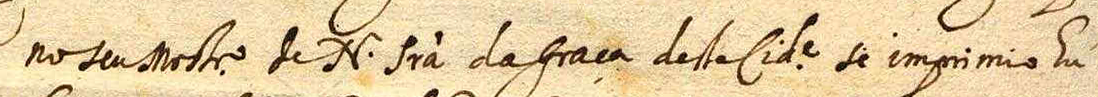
no seu Mostr.o de N. Srā da Graça desta Cid.e se imprimio hū
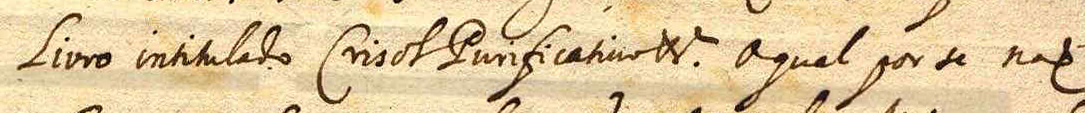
Livro intitulado Crisol Punificatiuo &.a O qual por se naõ
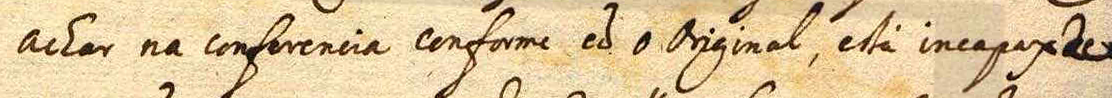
achar na conferencia conforme cō o Original, está incapax de
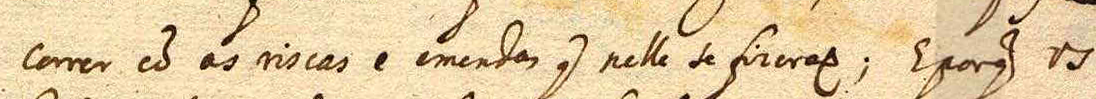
correr cō as riscas e emendas q̄ nelle se fizeraõ; E porq̄ os
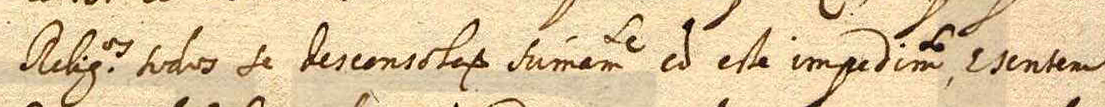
Relig.os todos se desconsolaõ sumamte cō este impedimto, E sentem
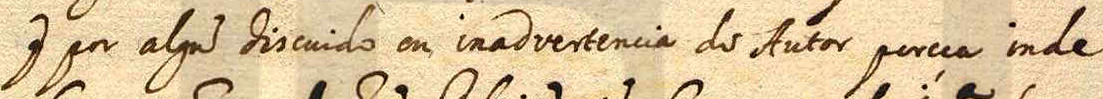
q̄ por algū discuido ou inadvertencia do Autor pereça inde
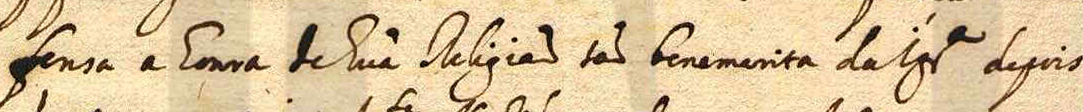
fensa a honra de huā Religiaõ taõ benemerita da Igr.a depois
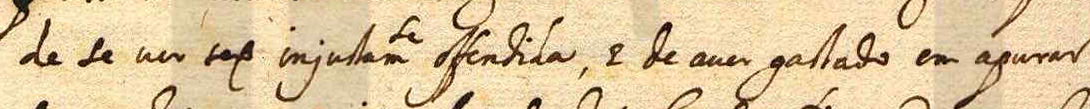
de se uer taõ injustamte offendida, E de auer gastado em apurar
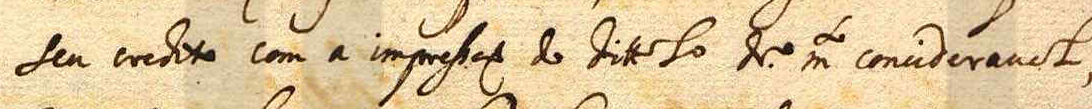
seu credito com a impressaõ do ditto Lo dr.o mto concideraueL,
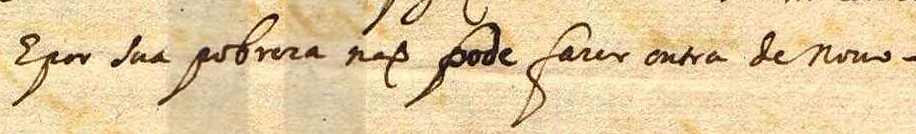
E por sua pobreza naõ pode fazer outra de nouo.
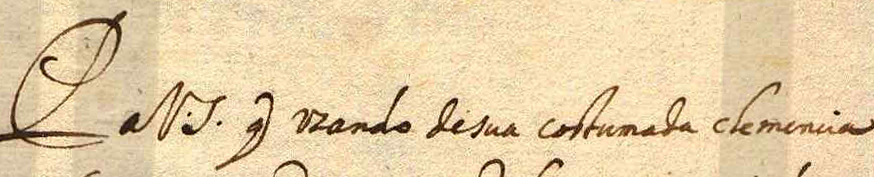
P a V. S. q̄ vzando de sua costumada clemencia
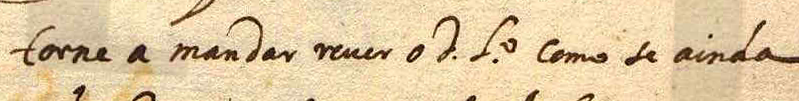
torne a mandar reuer o d. l.o como se ainda
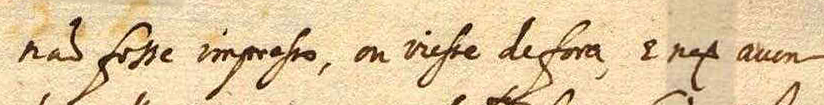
naõ fosse impresso, ou viesse de fora, E naõ auen
